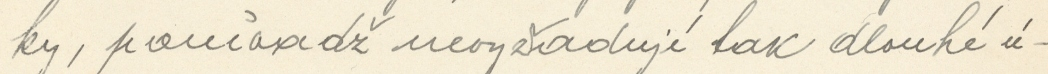ky, poněvadž nevyžadují tak dlouhé ú-
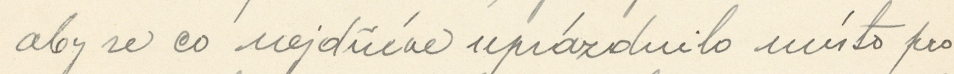aby se co nejdříve uprázdnilo místo pro
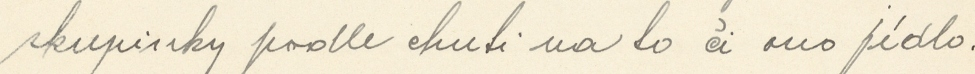skupinky podle chuti na to či ono jídlo.
